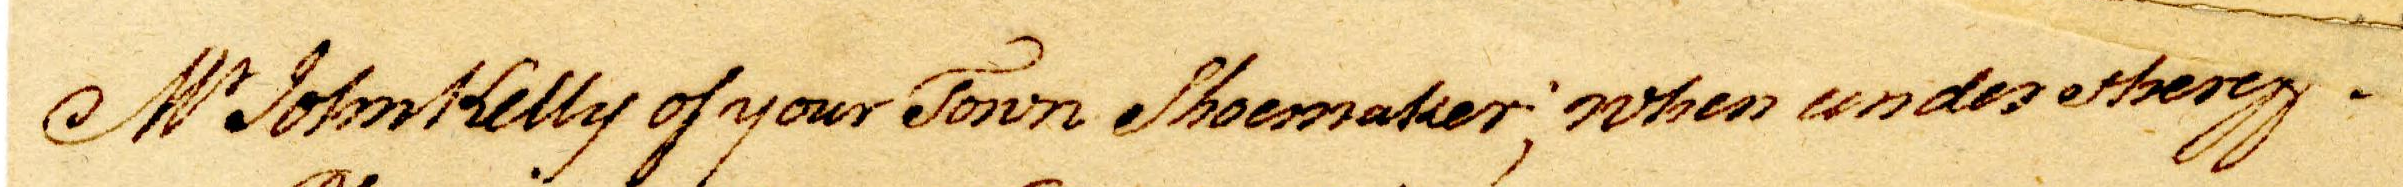M^r John Kelly of your Town Shoemaker; when under there
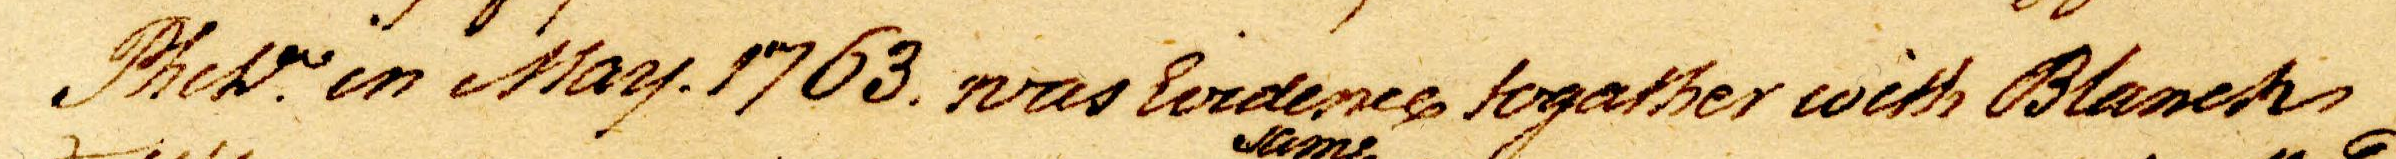Phil^a. in May 1763. was Evidence together with Blanch
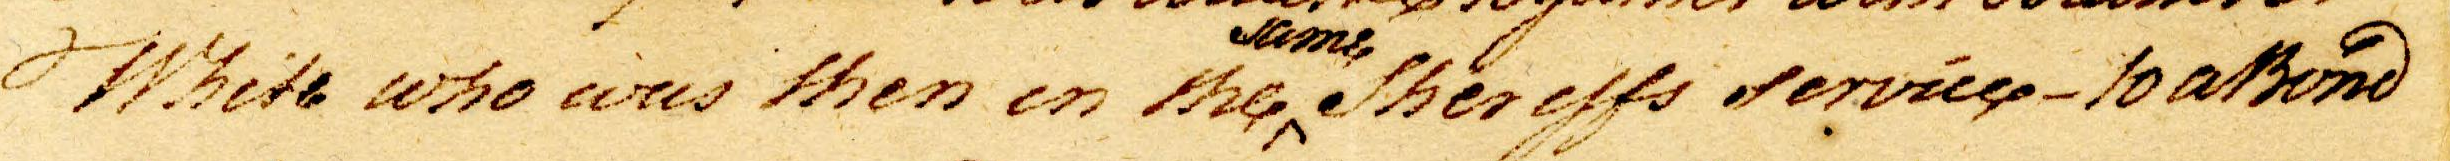White who was then in the ^ Sheriffs service- to attend
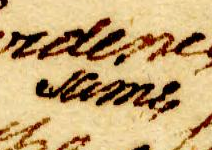same
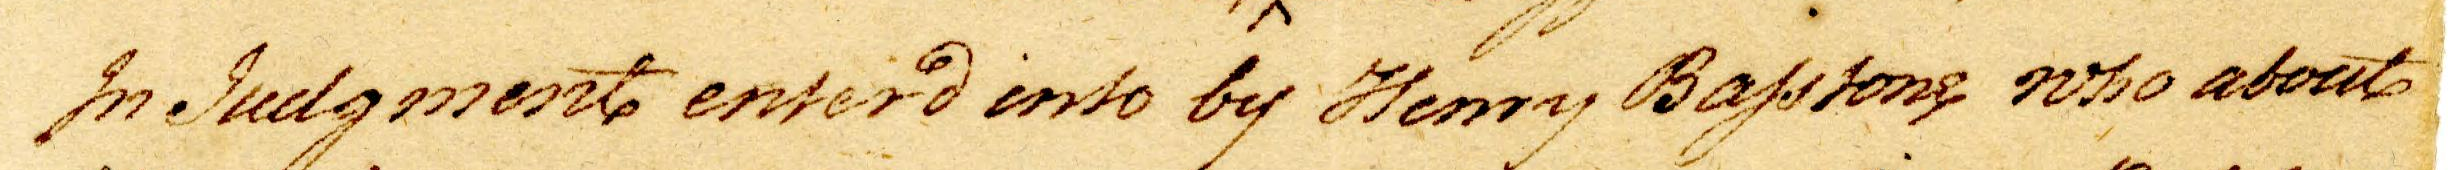In Judgment enter'd into by Henry Basstone who about
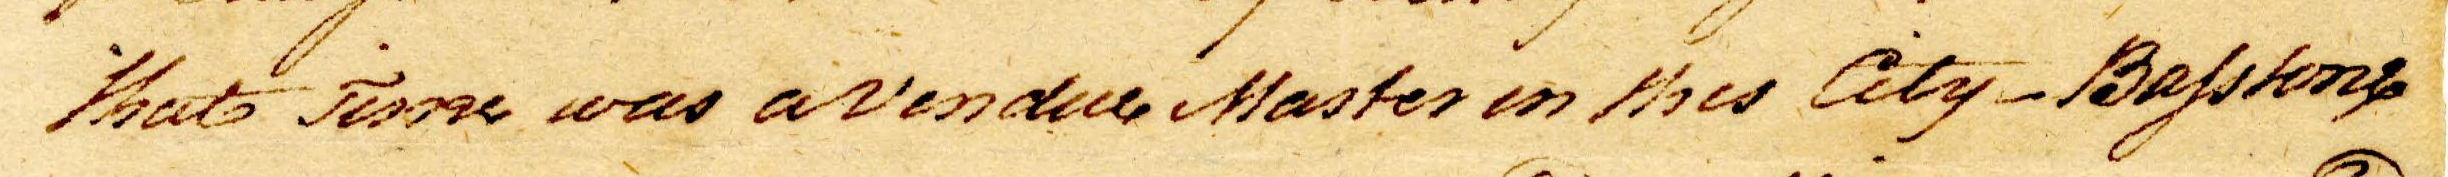that time was a Vendue Master in this City- Basstone
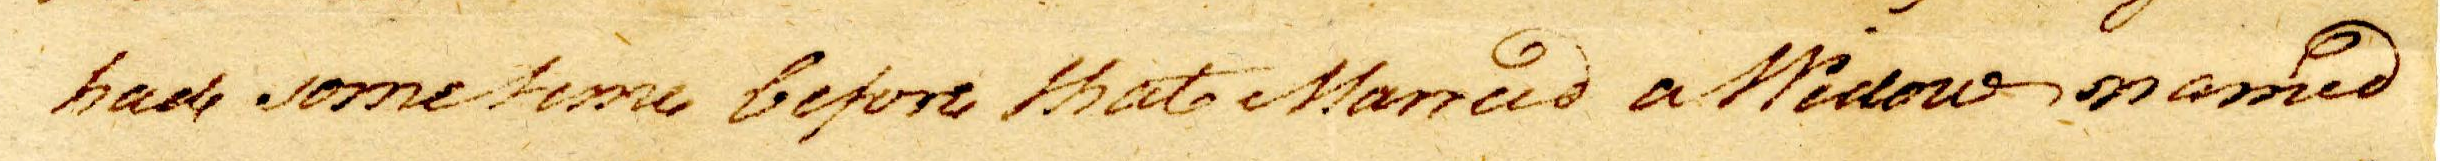had some time before that Married a Widow named
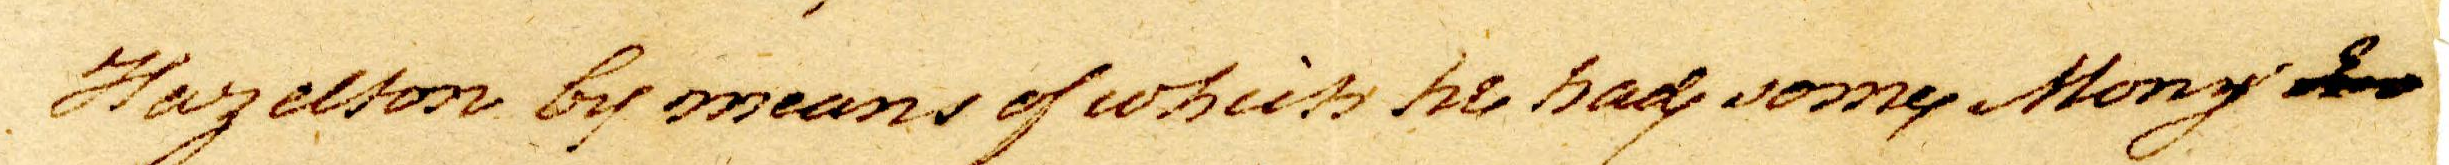Hazelton by means of which he had some Mony [__]
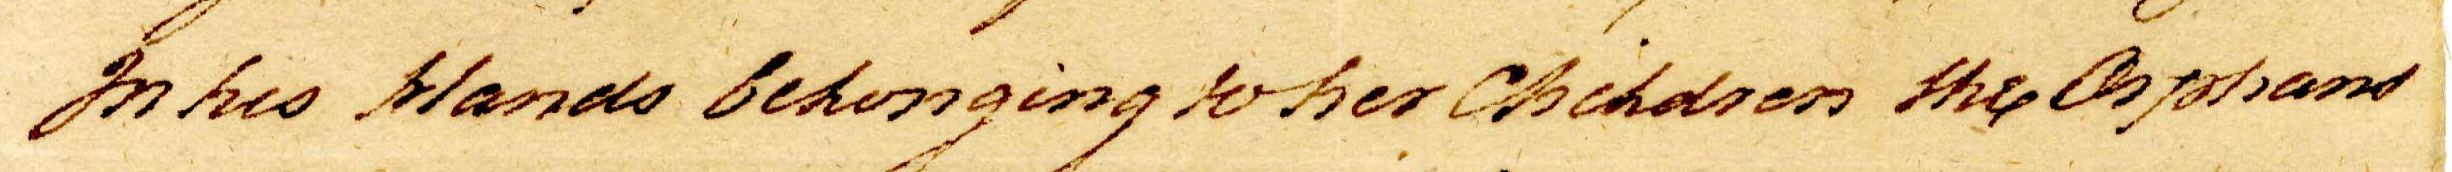In his Hands belonging to her Children the Orphans
